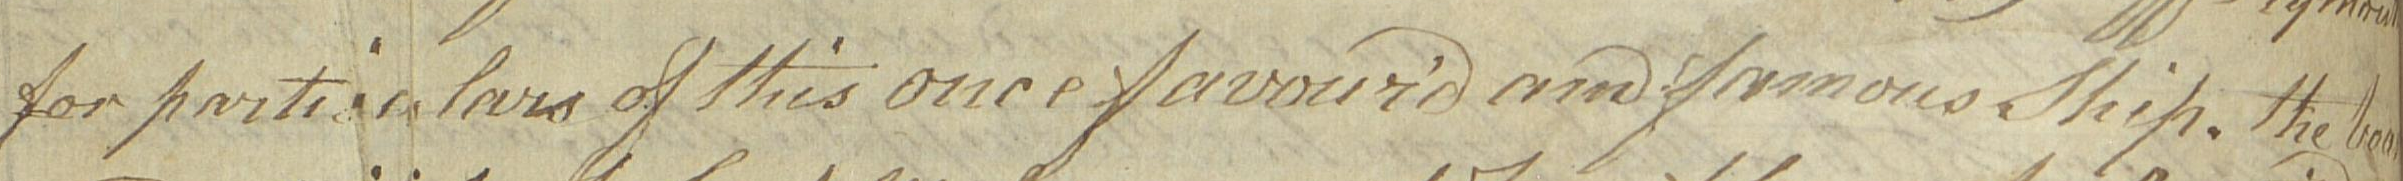for particulars of this once favour'd and famous Ship. the bo-
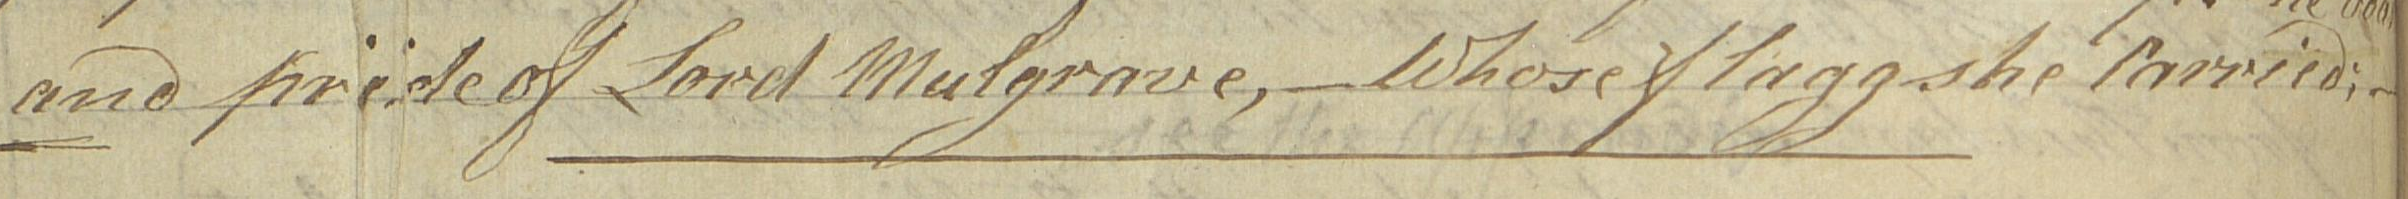and pride of Lord Mulgrve Whose flagg she Carried;
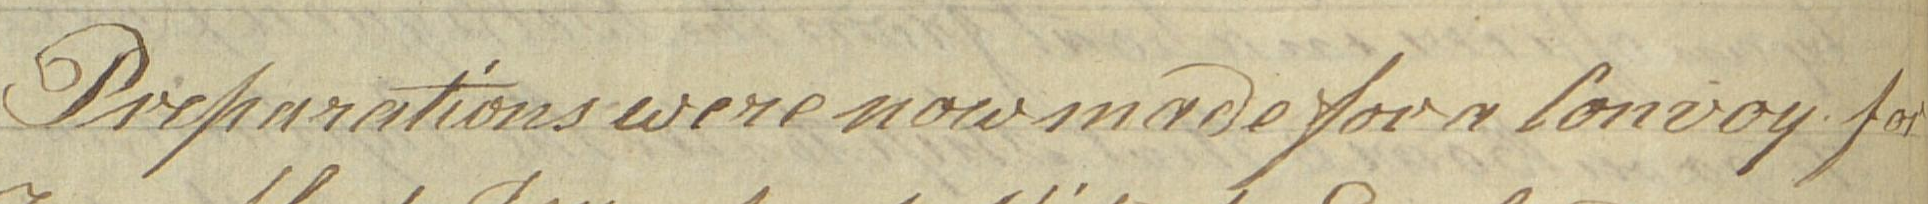Preparations were now made for a Convoy for
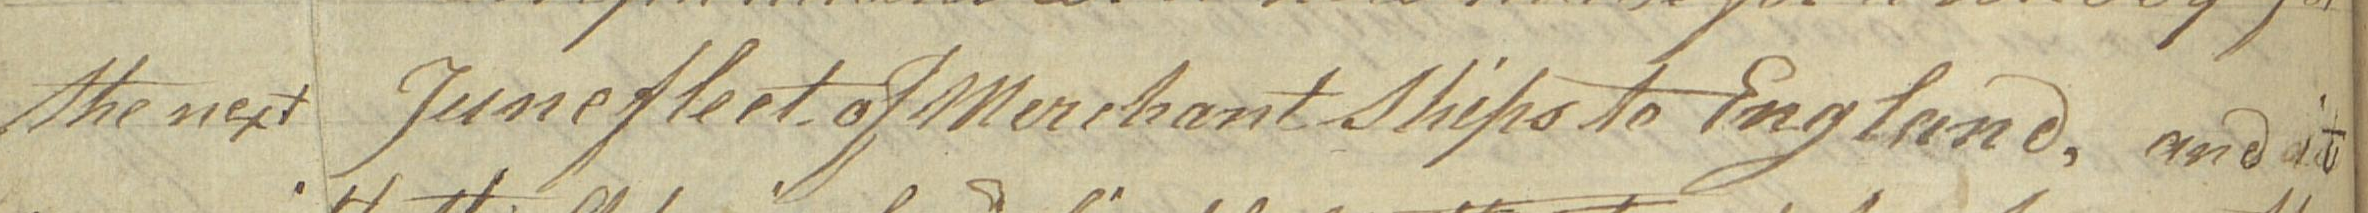the next June fleet of Merchant Ships to England, and it
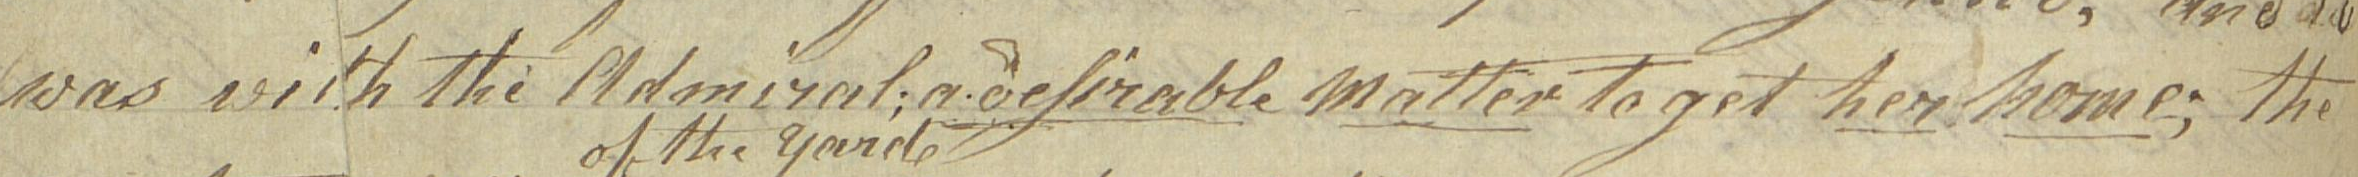was with the Admiral desirable matter to get her home; the
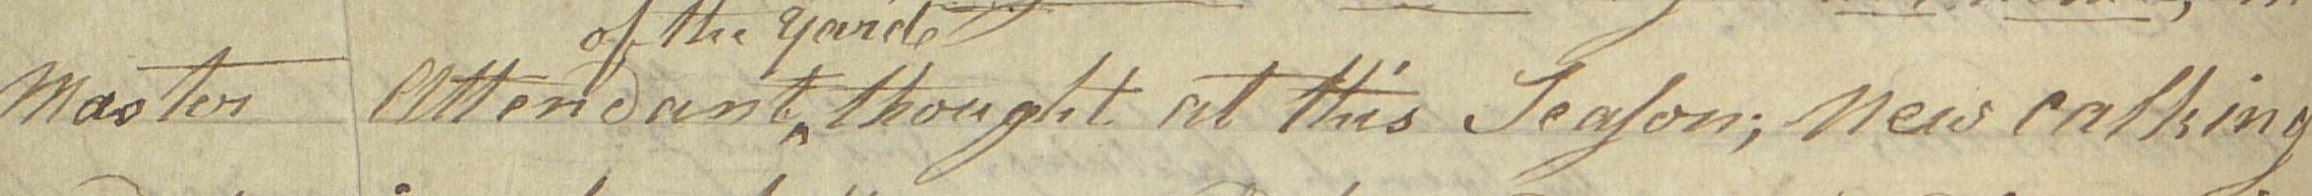Master Attendant ^ thought at this Season, New calking
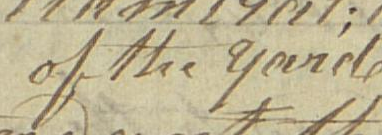of the Yard
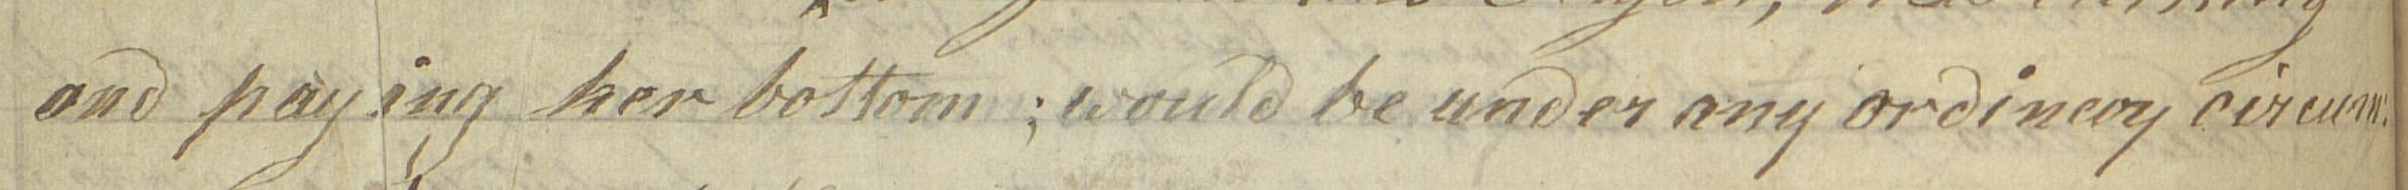and paying her bottom; would be under my ordinary circum-
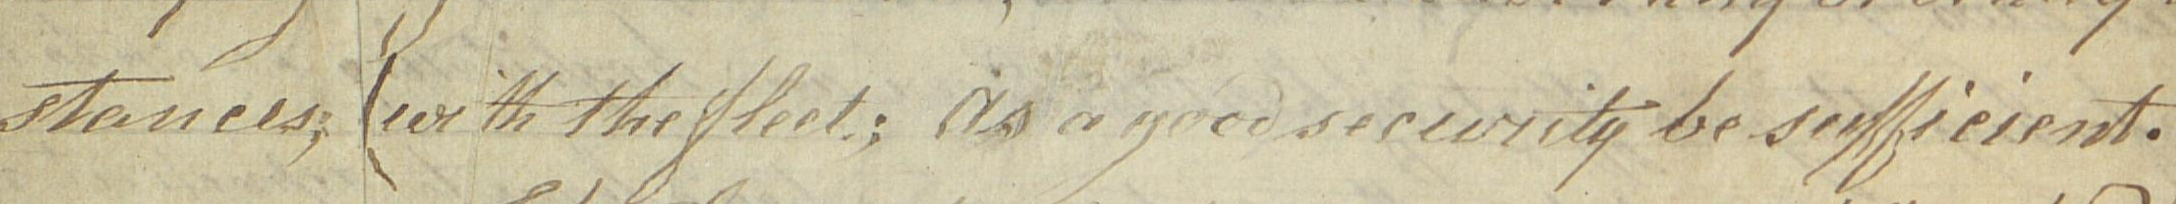-stances, (we to the fleet; as a good security be sufficient.
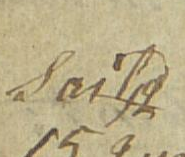Saild
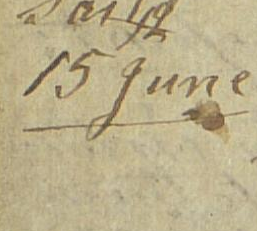15 June
